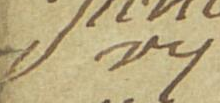ry
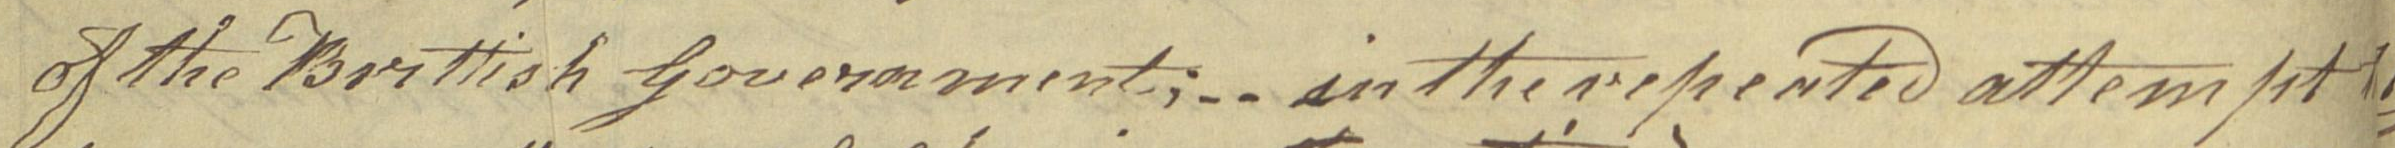of the Brittish Government;. in the repeated attempt
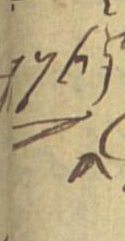-776
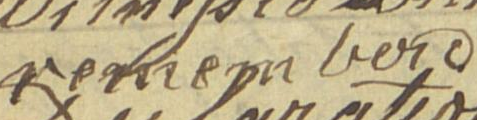rememberd
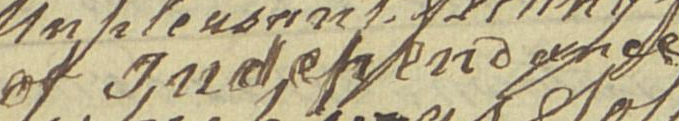of Independence
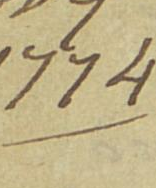1774
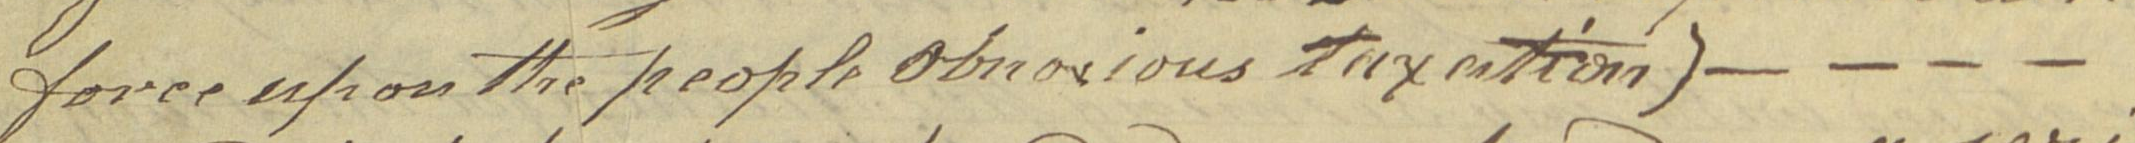force upon the people Obnoxious taxation)
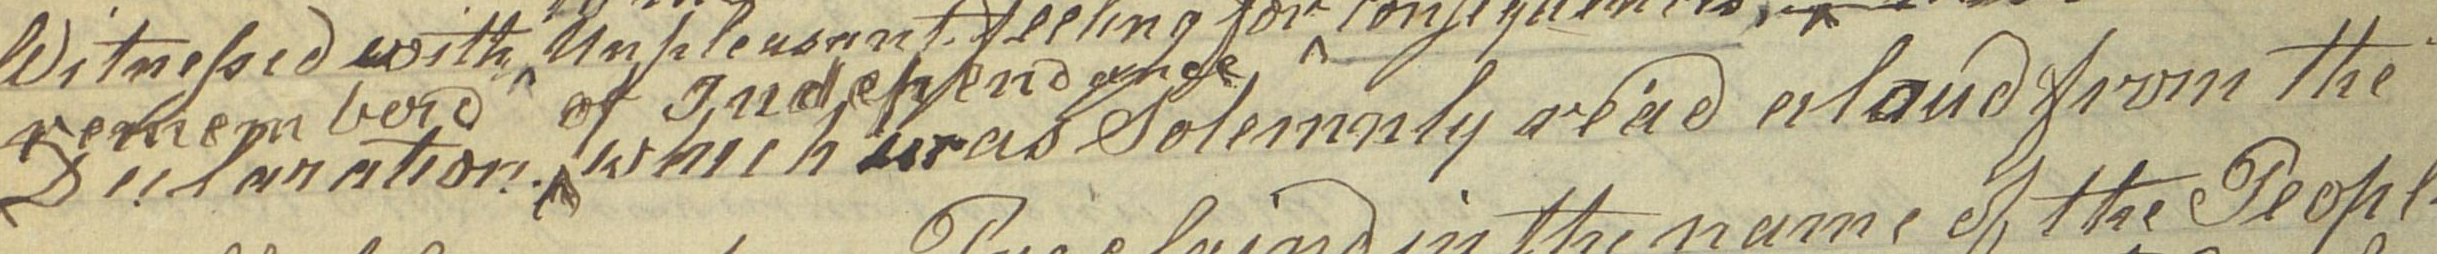^ Declaration ^ which was Solemnly read aloud from the
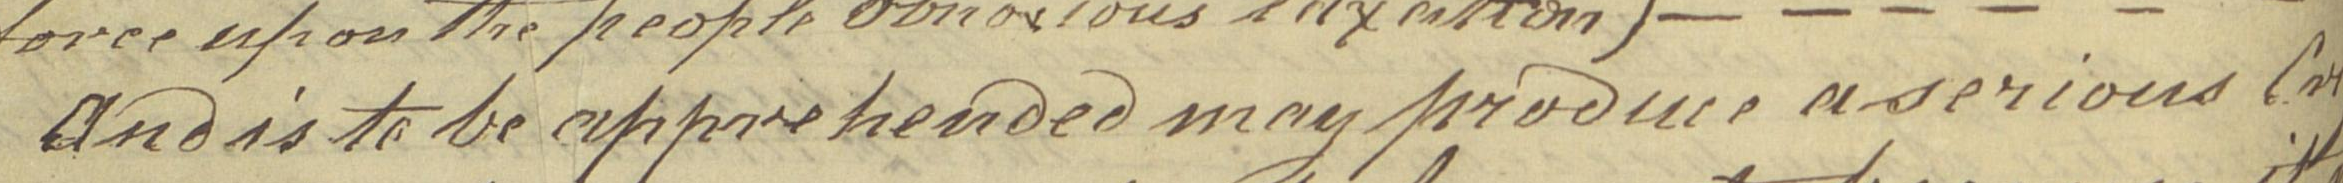and is to be apprehended may produce a serious C-
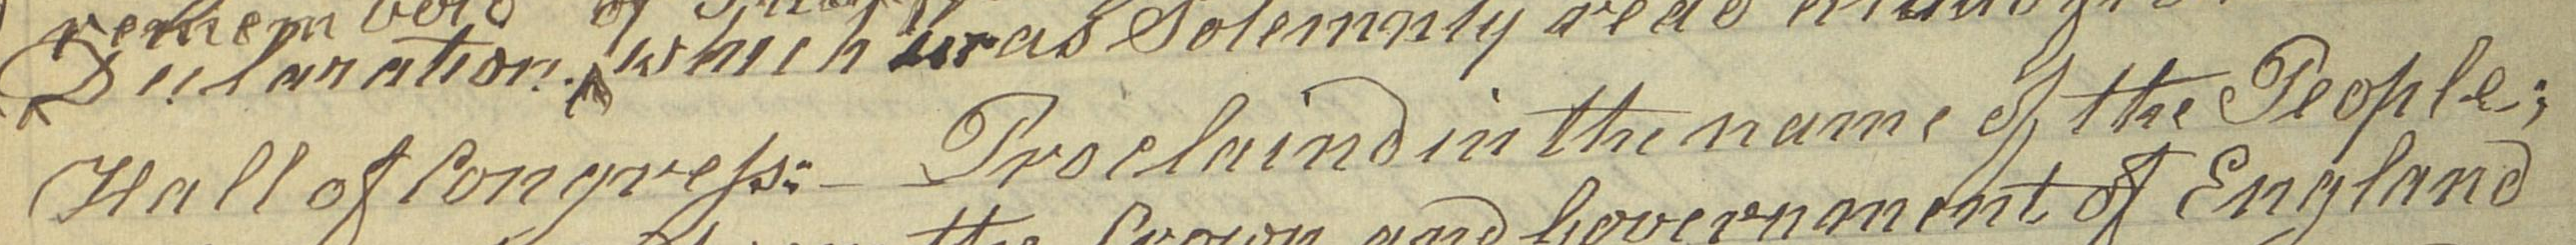Hall of Congress:- Proclaimd in the name of the People;
